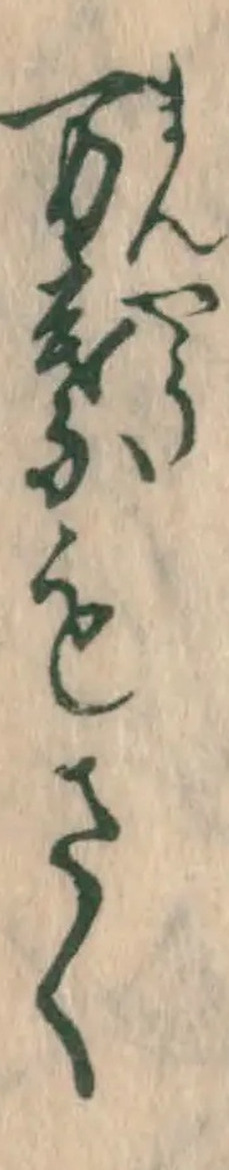万葉もさく
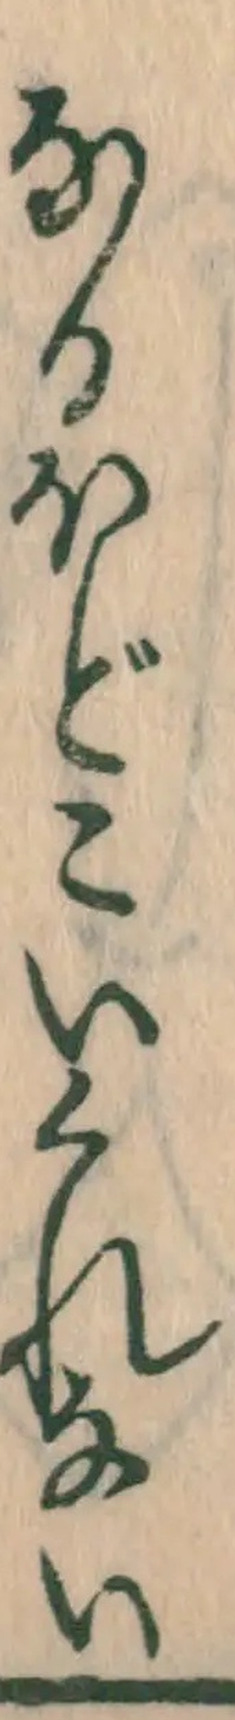なるほどこいくれない
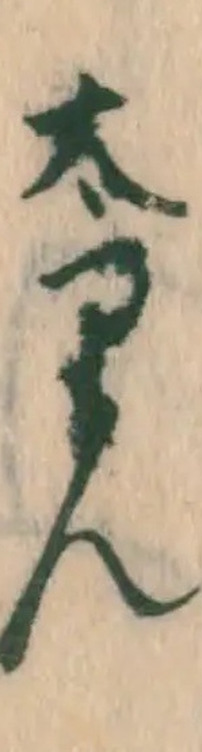太りん
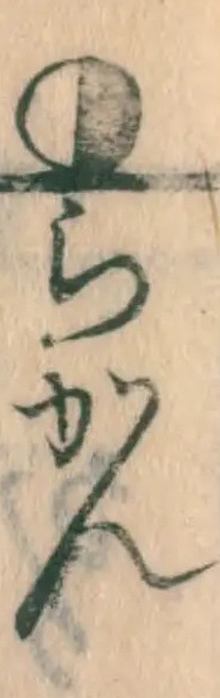らかん
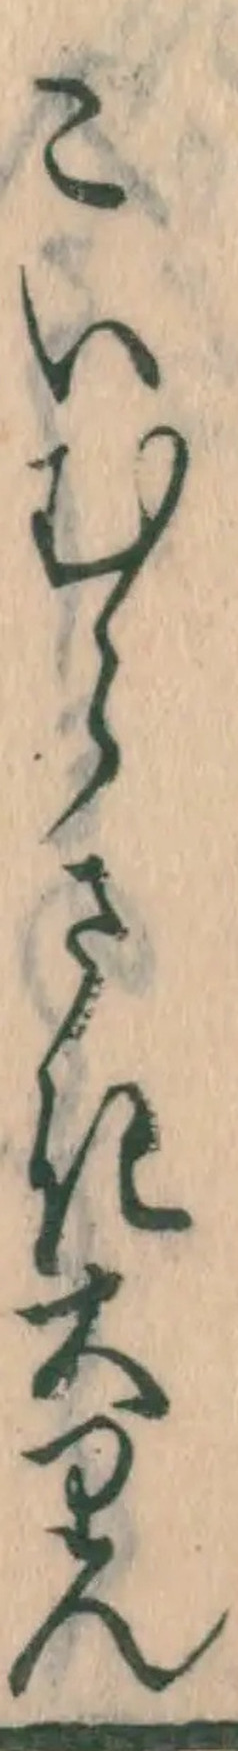こいむらさき大りん
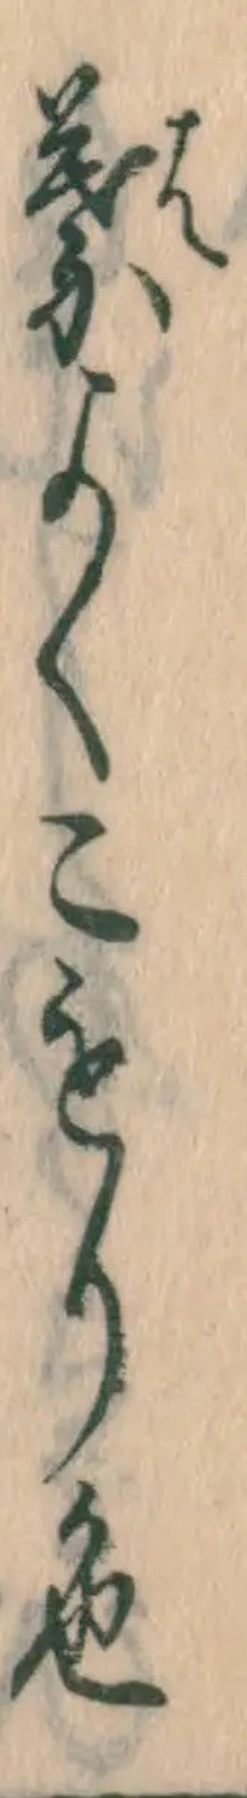葉よくこもり色
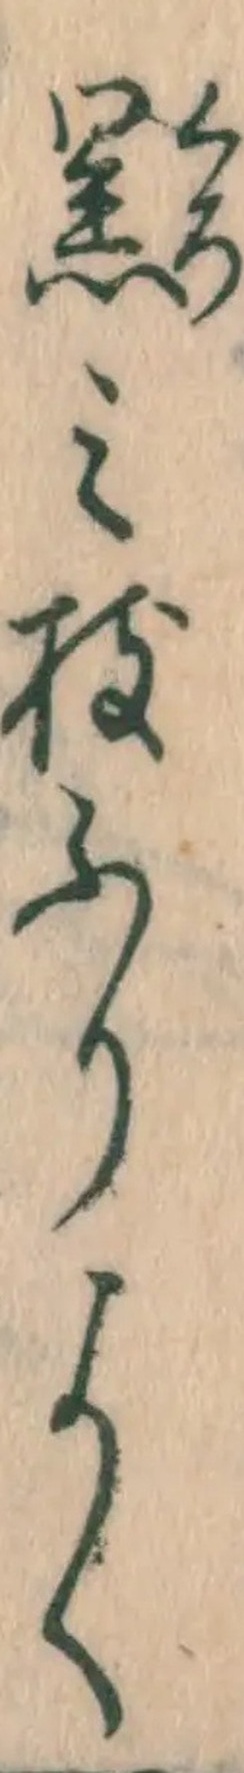黒み枝ふりよく
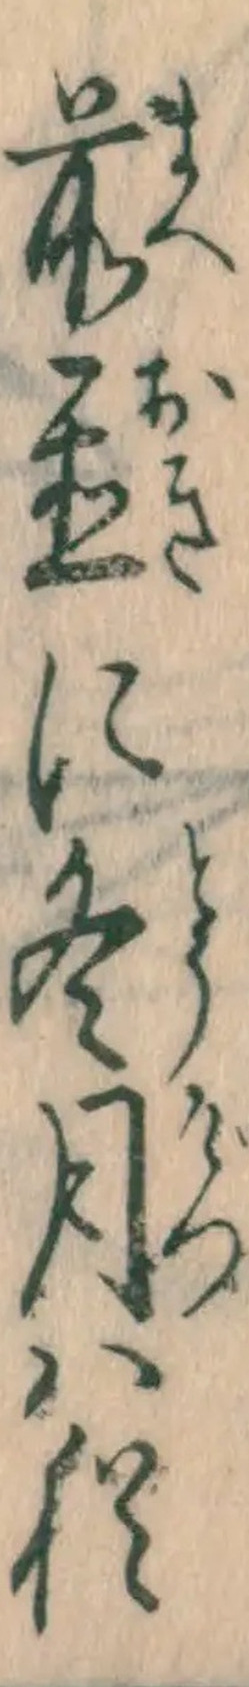前置に冬月は程
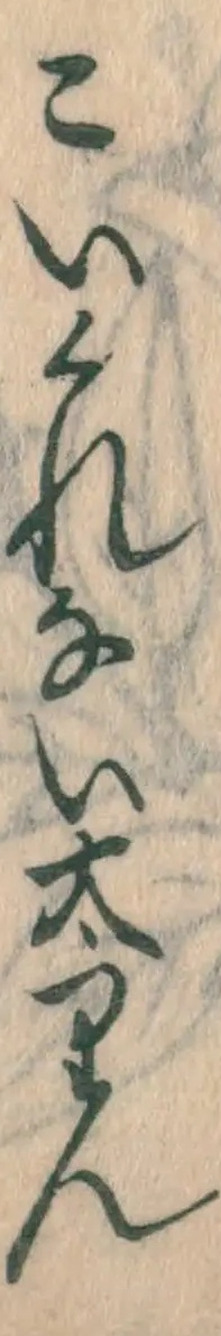こいくれない太りん

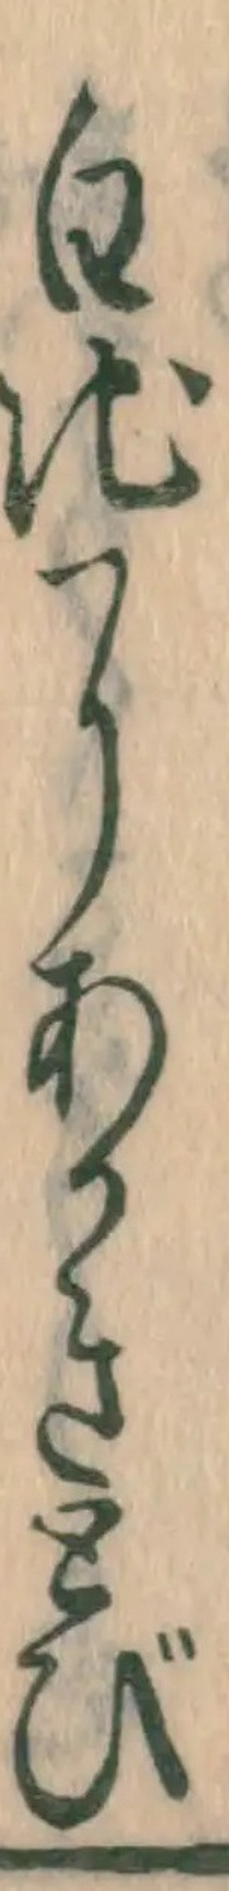白地にあかきとび
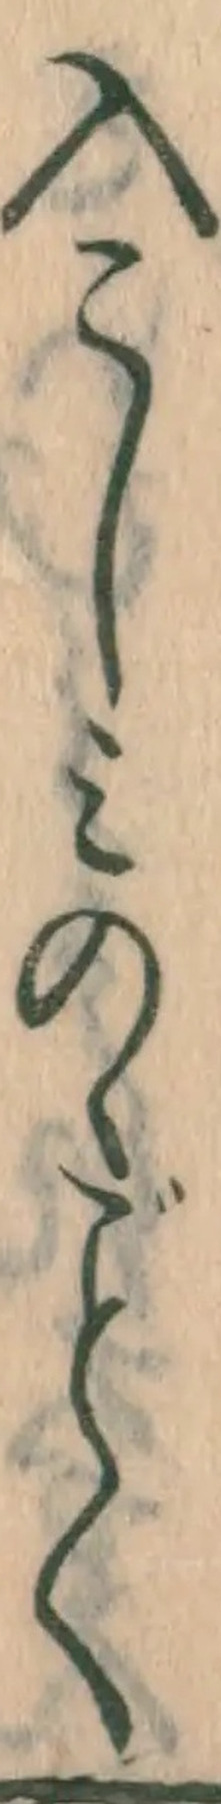入こしみのゝごとく
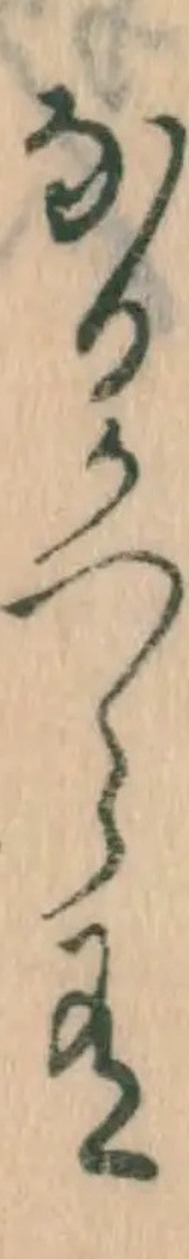なるかつら有
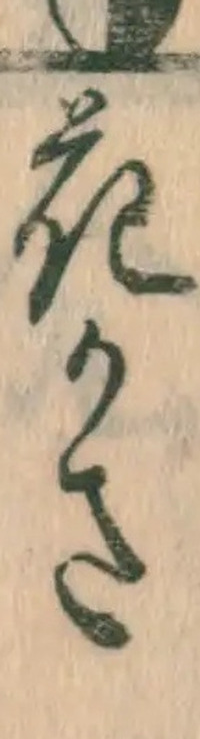花かさ
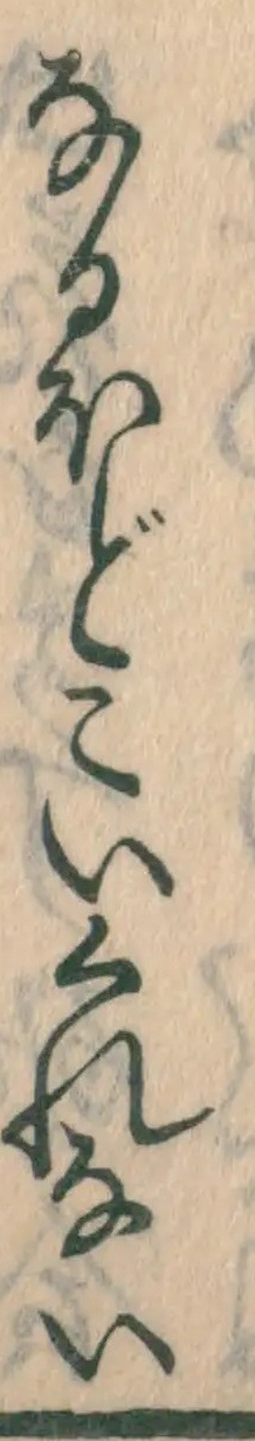なるほどこいくれない

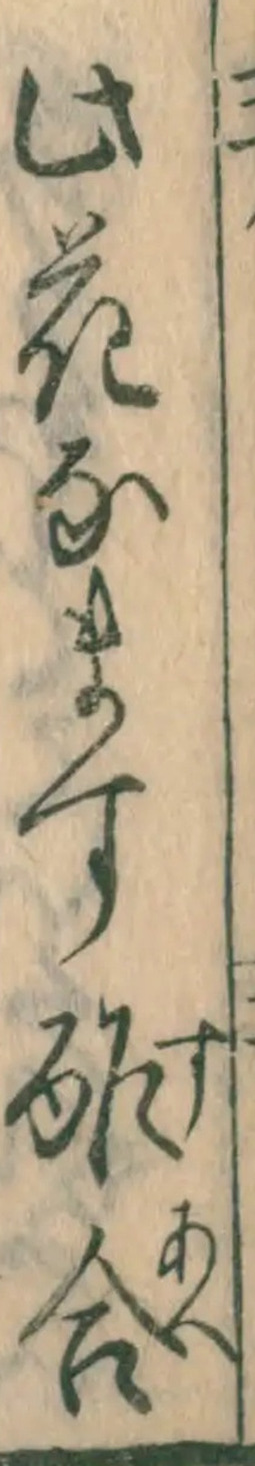此花なます酢合
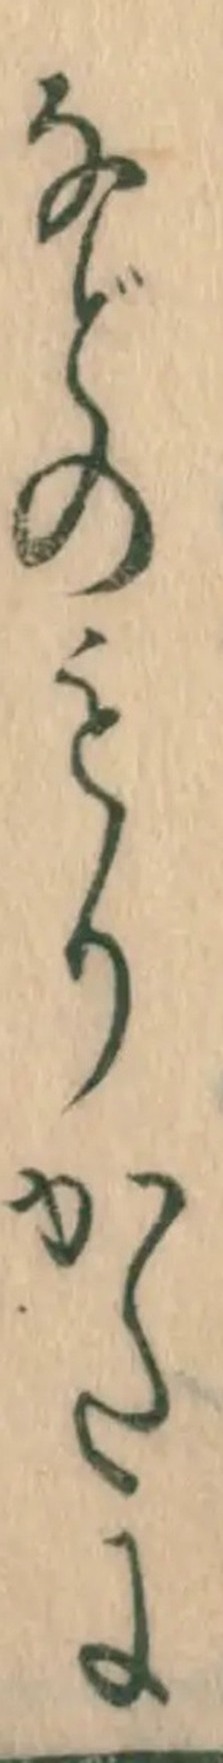などのもりかたに
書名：錦繍枕 5巻. [5]
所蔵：国立国会図書館 National Diet Library, JAPAN
